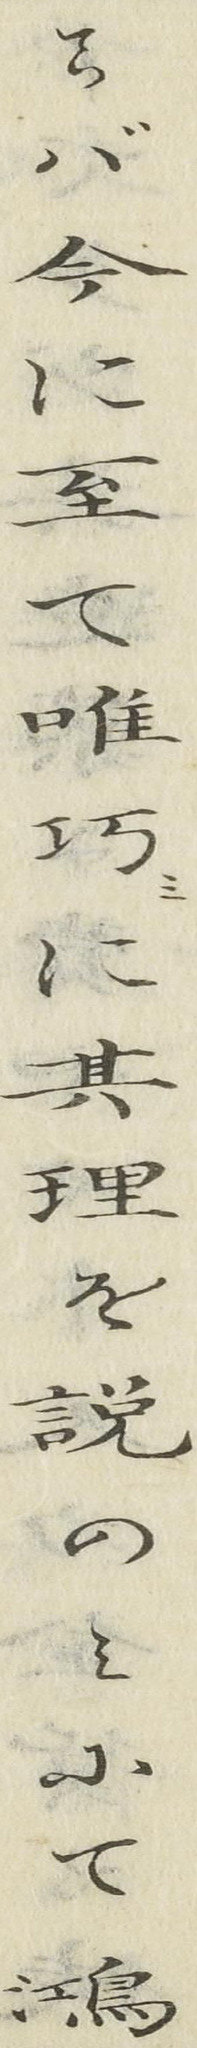らば今に至て唯巧其理を説のみにて鴻
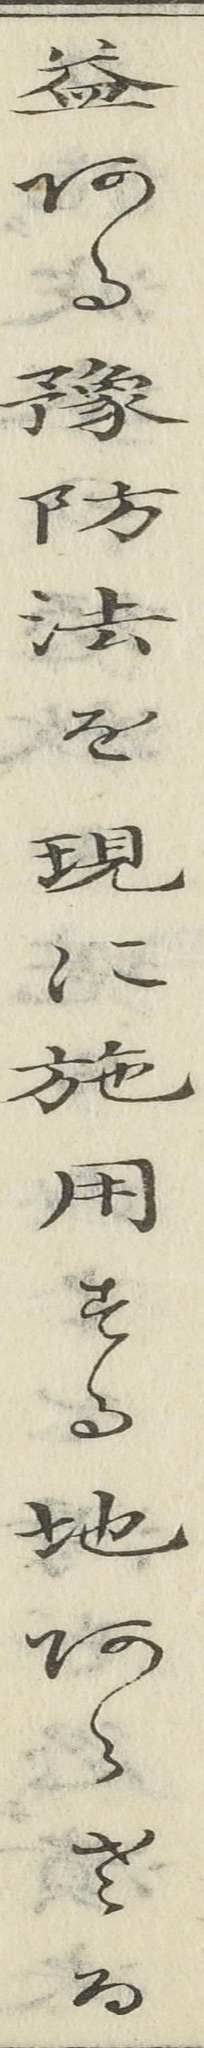益ある豫防法を現に施用する地あらさる
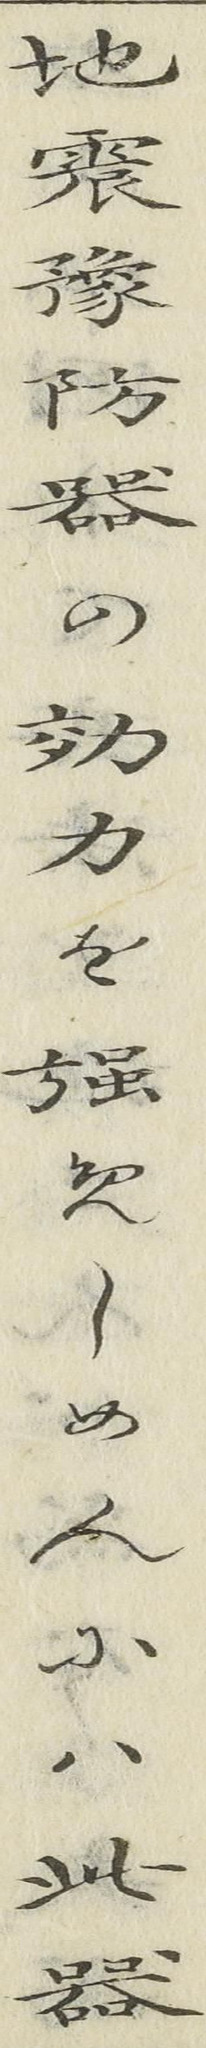地震予防器の効力を強めしめんには此器
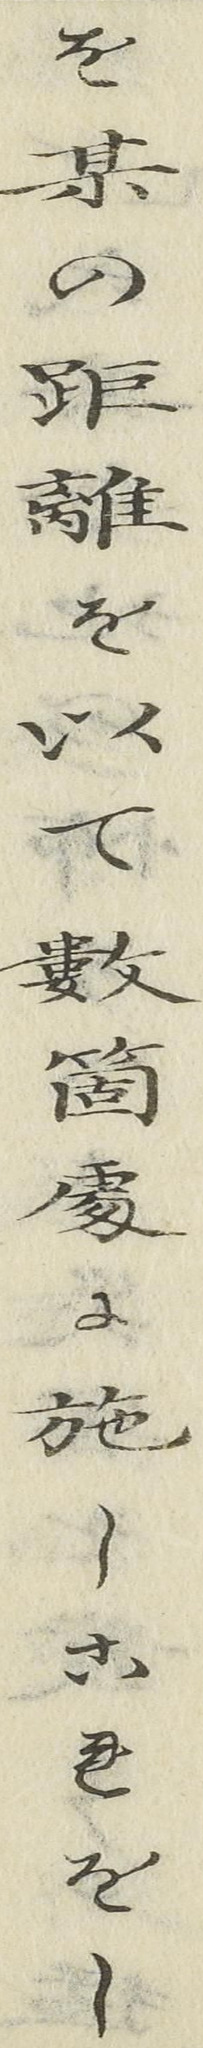を某の距離を以て数箇処に施しこれをし
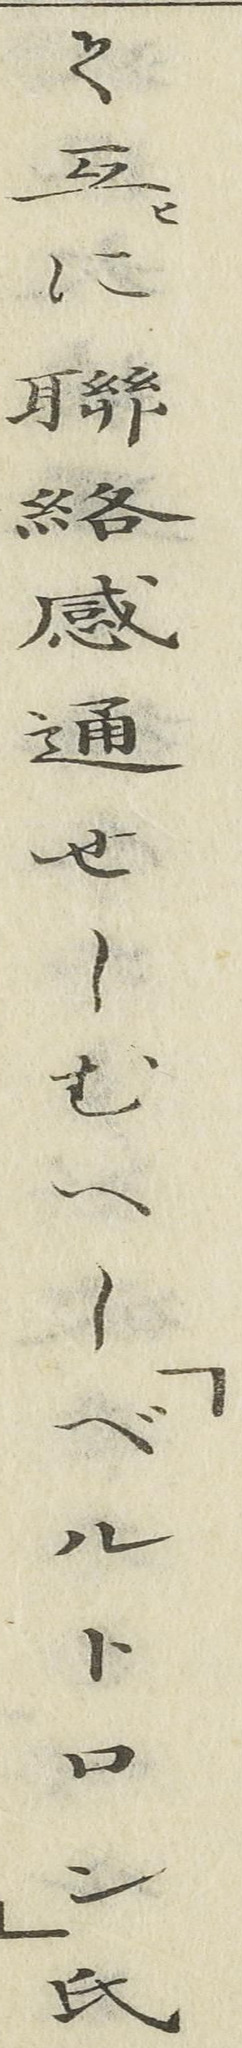て互聯絡感通せしむへし「ベルトロン」氏
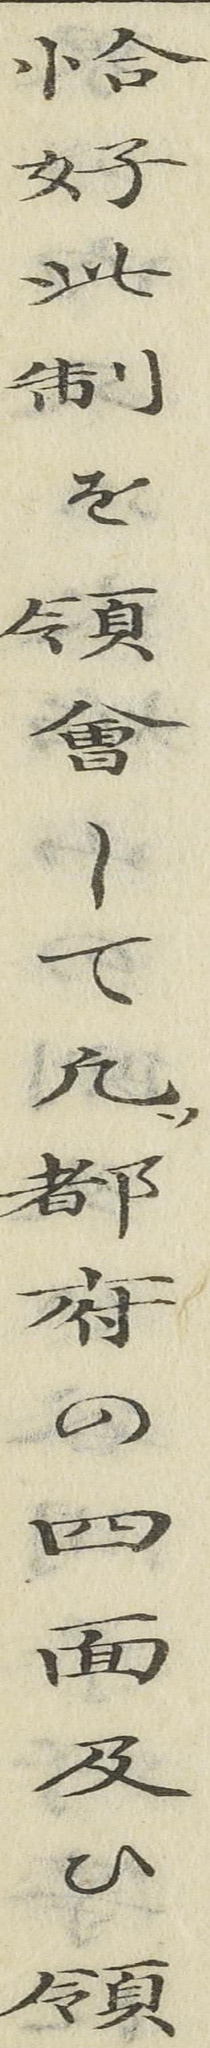恰好此制を領会して凡都府の四面及ひ領

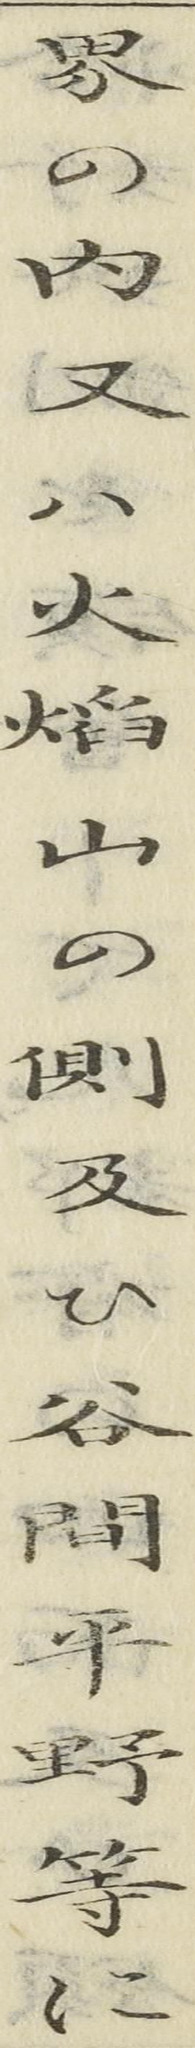界の内又は火焰山の側及ひ谷間平野等に
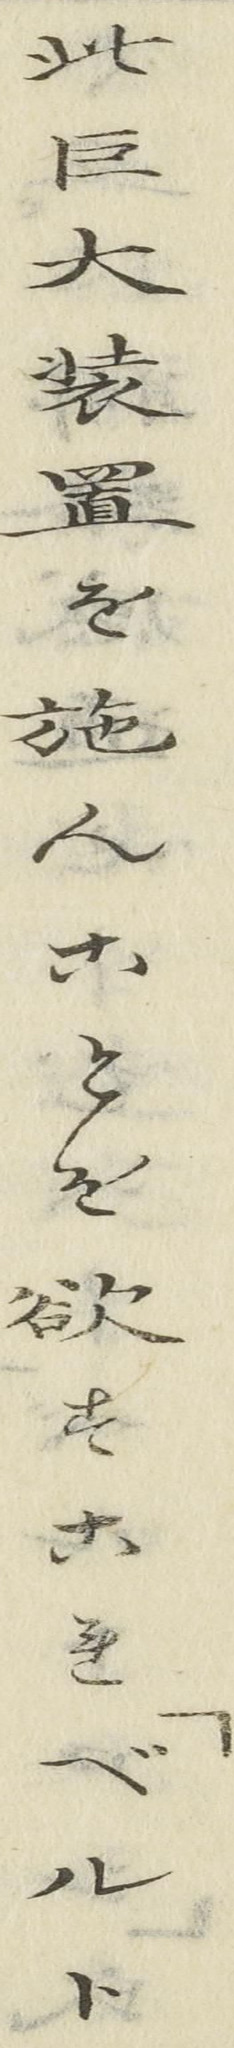此巨大装置を施んことを欲すこれ「ベルト
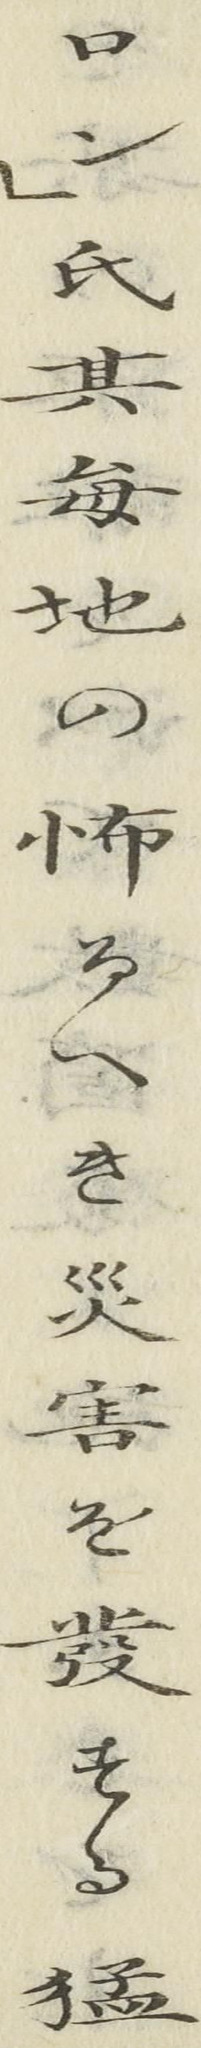ロン」氏其毎地の怖るへき災害を発する猛
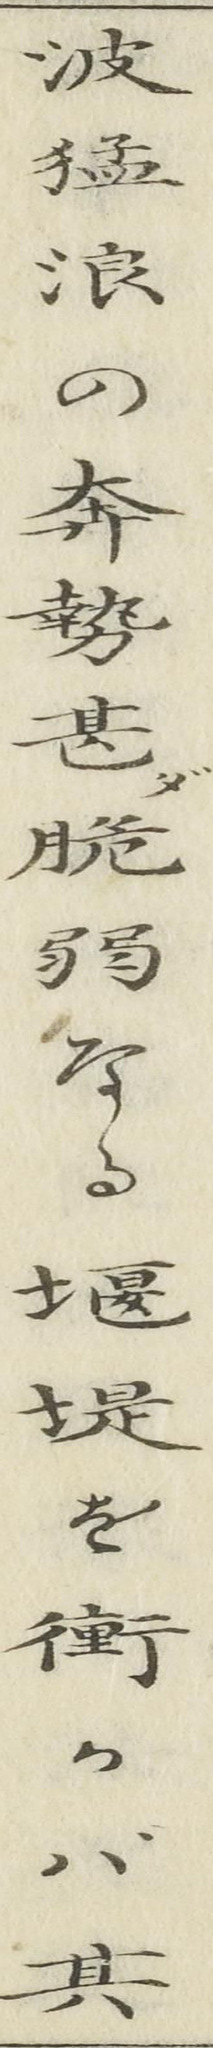波猛浪の奔勢甚脆弱なる堰堤を衝かば其
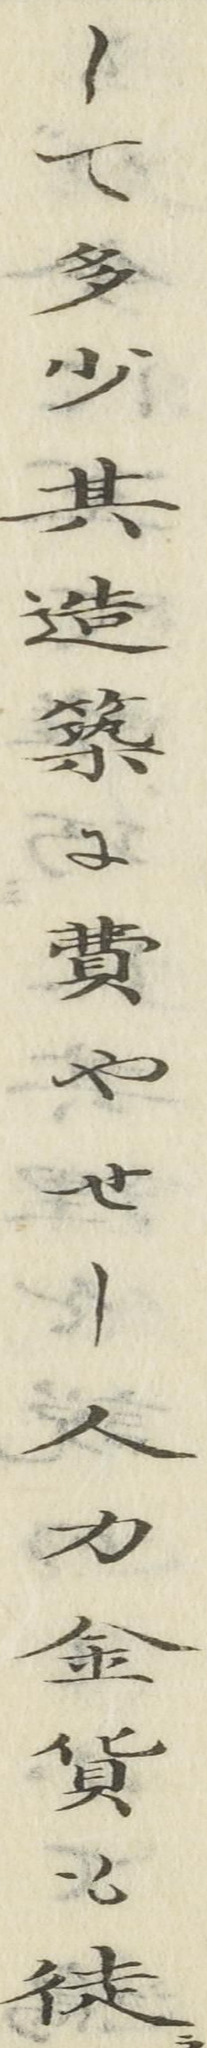して多少其造築に費やせし人力金貨も徒
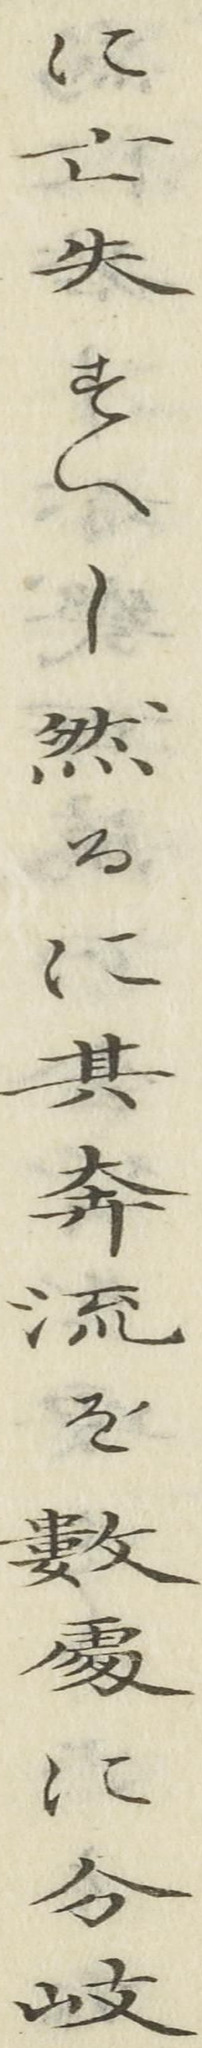に亡失すへし然るに其奔流を数処に分岐
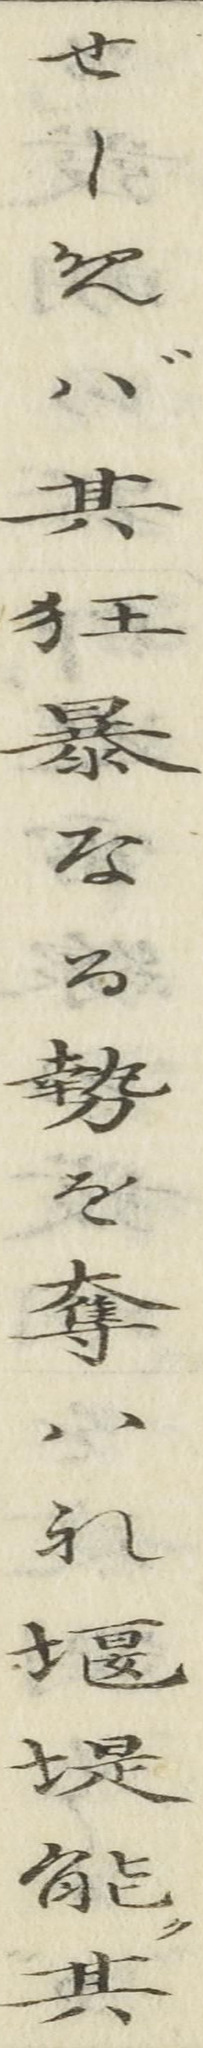せしめば其狂暴なる勢を奪はれ堰堤能其
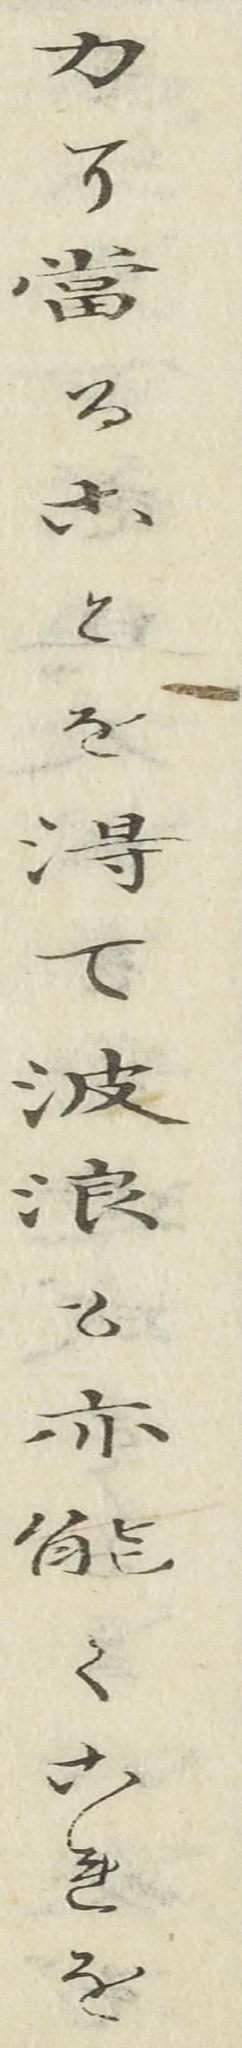力に当ることを得て波浪も亦能くこれを
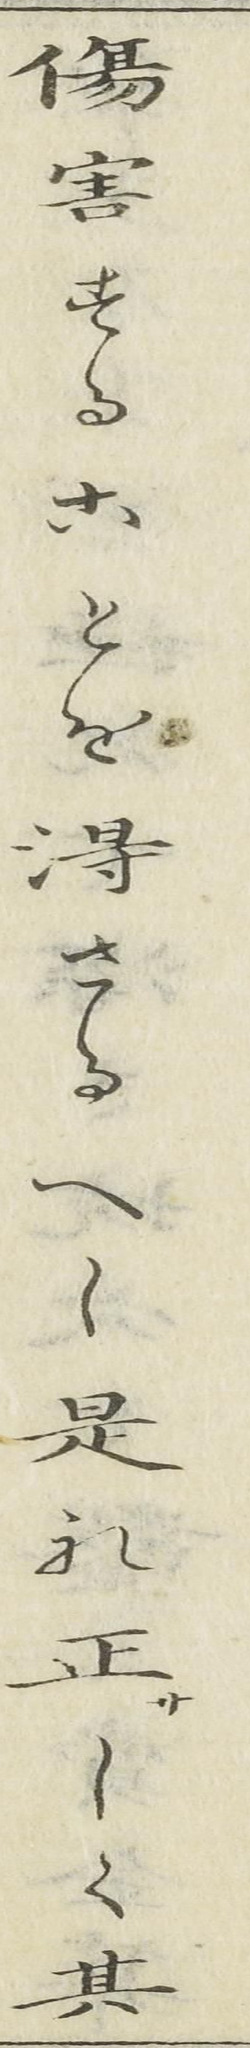傷害することを得さるへし是れ正其
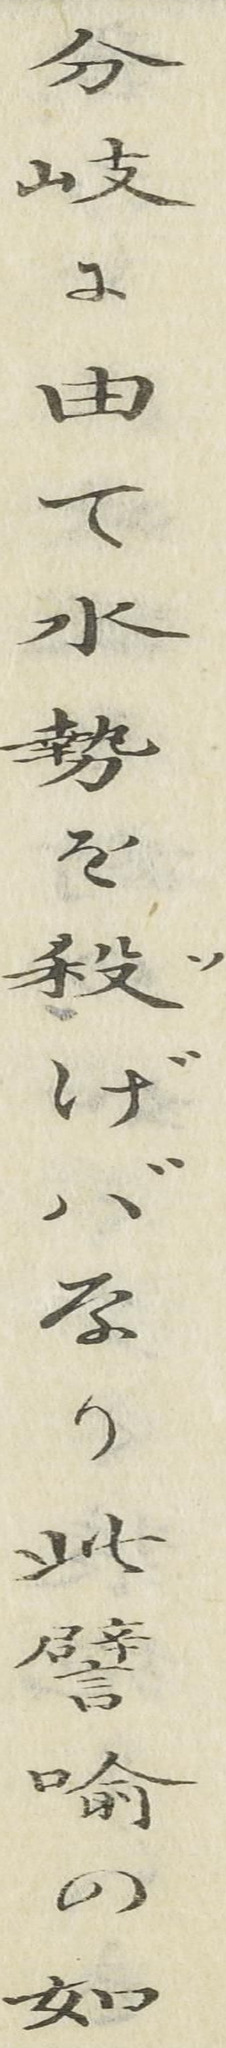分岐に由て水勢を殺げばなり此譬喩の如
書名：地震預防説
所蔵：東京大学地震研究所図書室 Earthquake Research Institute Library, The University of Tokyo, JAPAN
